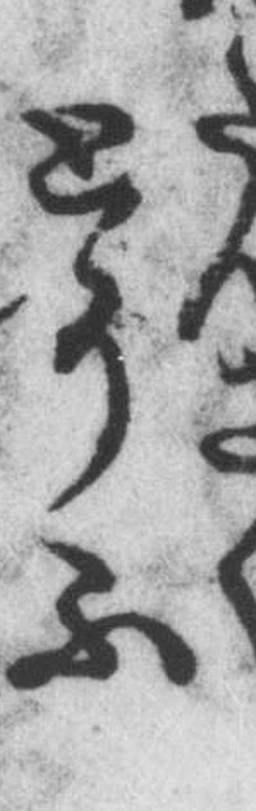とうふ
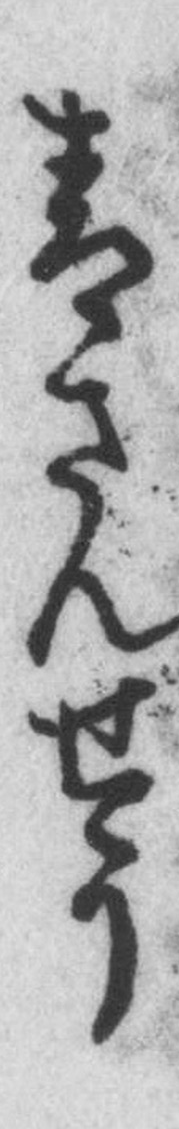青さんせう

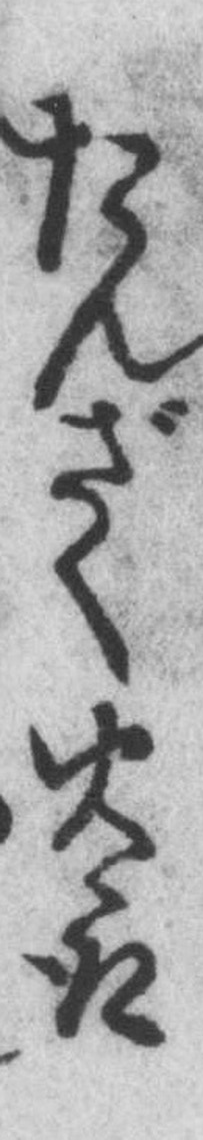たんざく火取柚
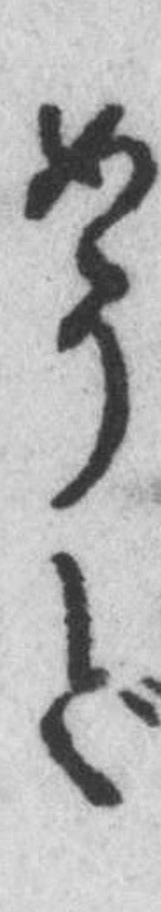めうど
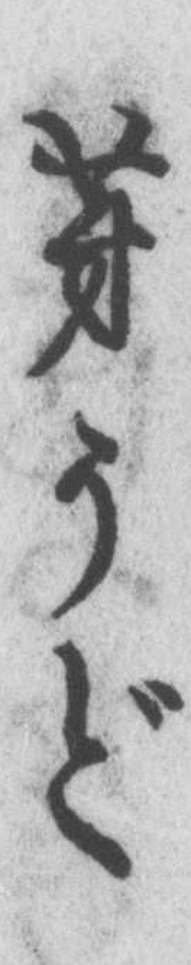めうど
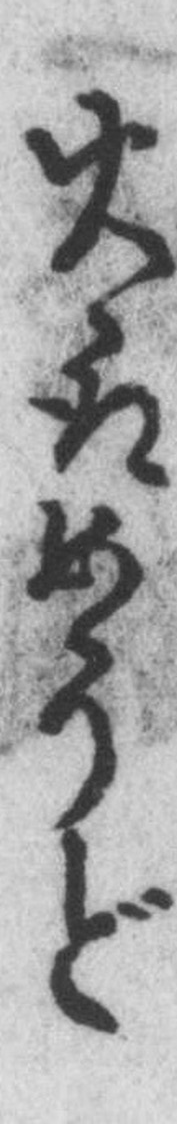火取めうど
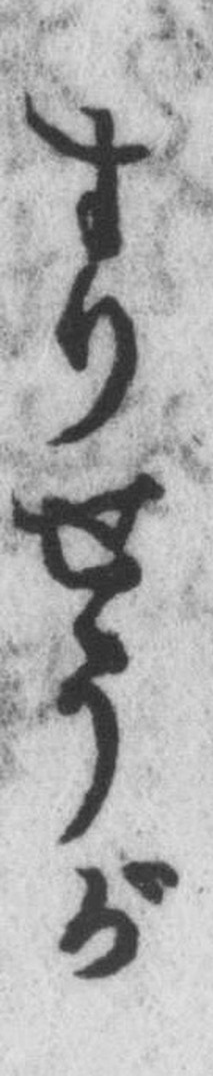すりせうが
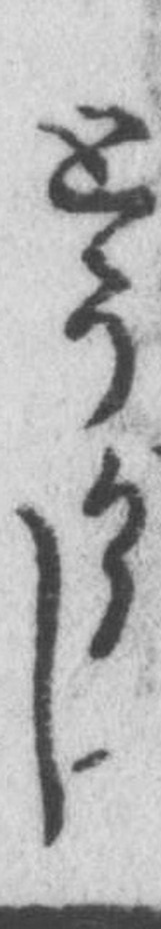とうがらし
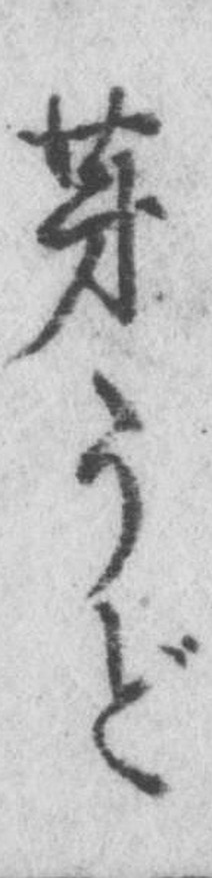めうど
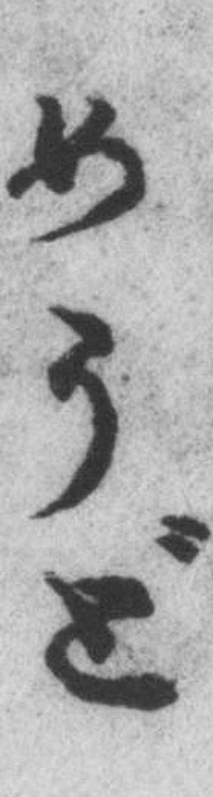めうど

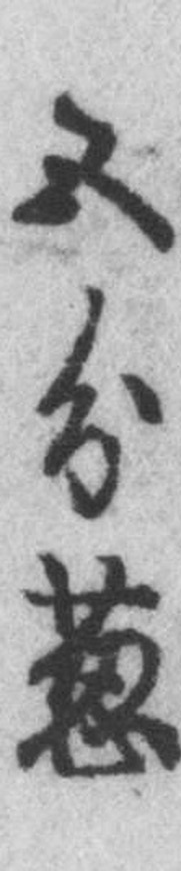五分葱
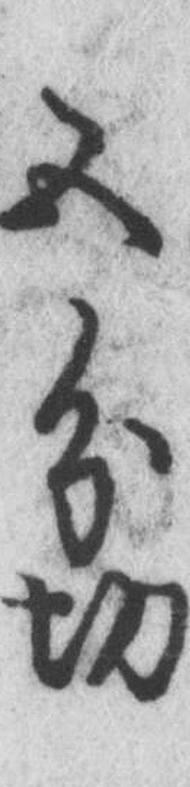五分葱
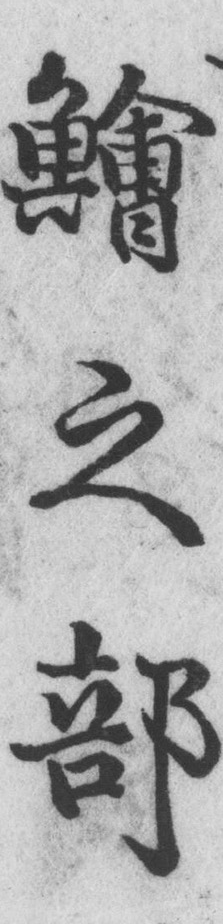鱠之部
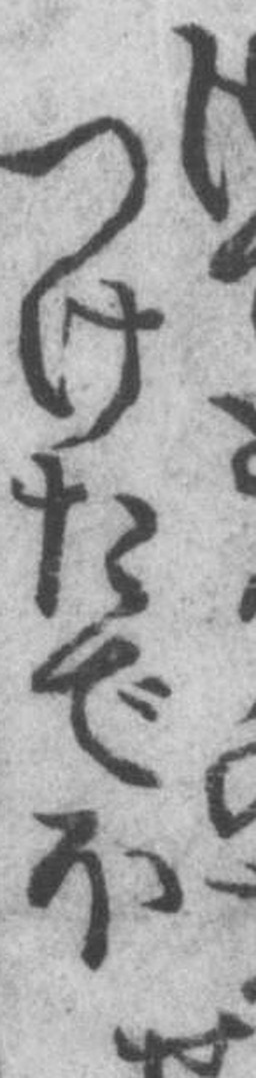つけたで不

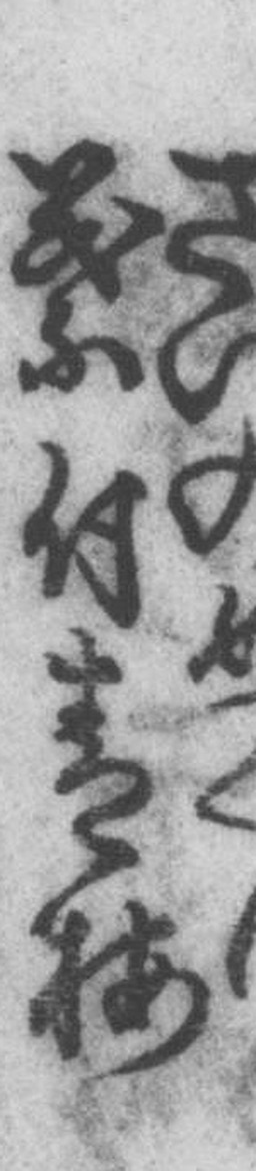葉付青梅

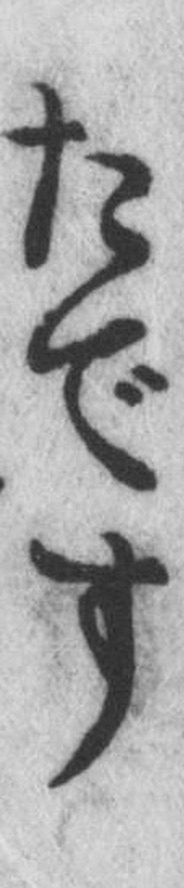たです
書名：料理伊呂波庖丁
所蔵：大阪府立大学学術情報センター 国文学研究資料館
